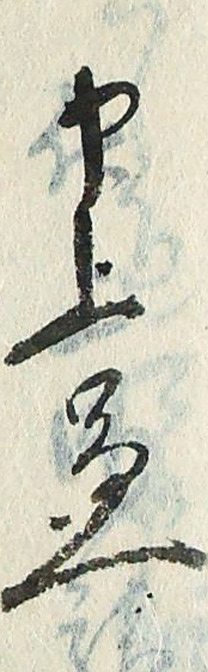申上覚
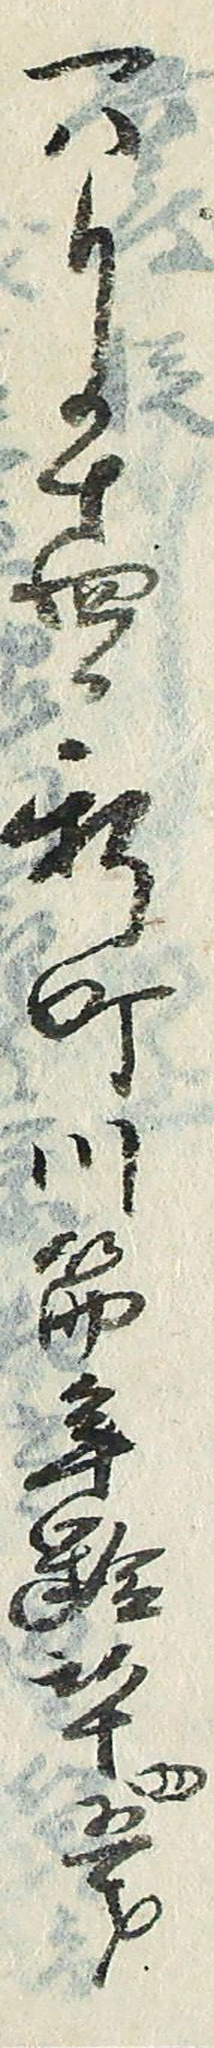八月十四日新町川筋年齢弐十四五才
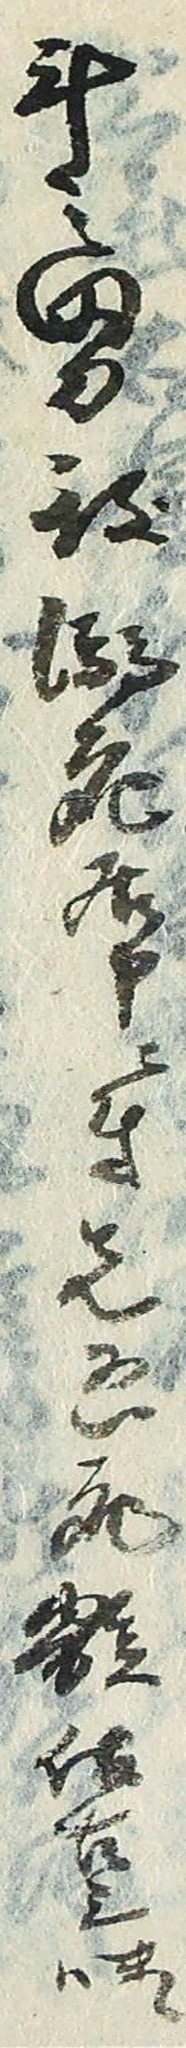計之男致溺死居申に付先右死骸佐古三昧へ
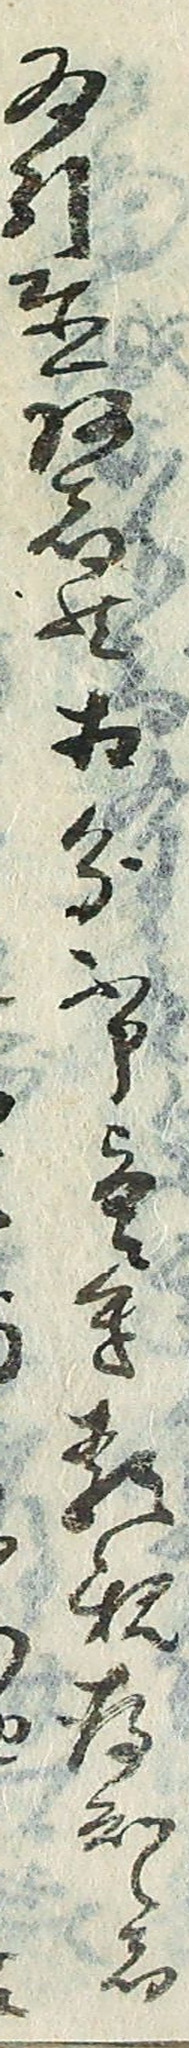為引置何者共相分不申旨に付類親存知之者
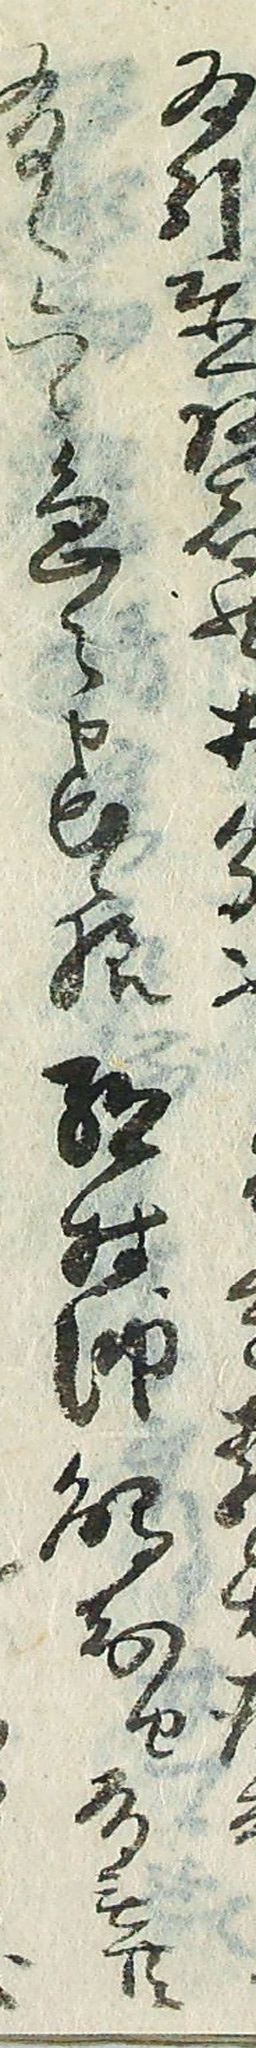有之候はゝ急々申出候様組村浦触知せ有無共
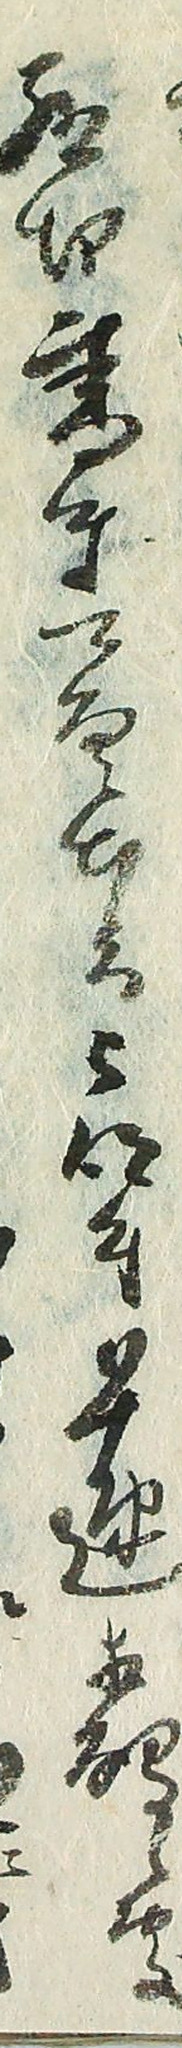組切書付可差出旨被仰付早速相触候処
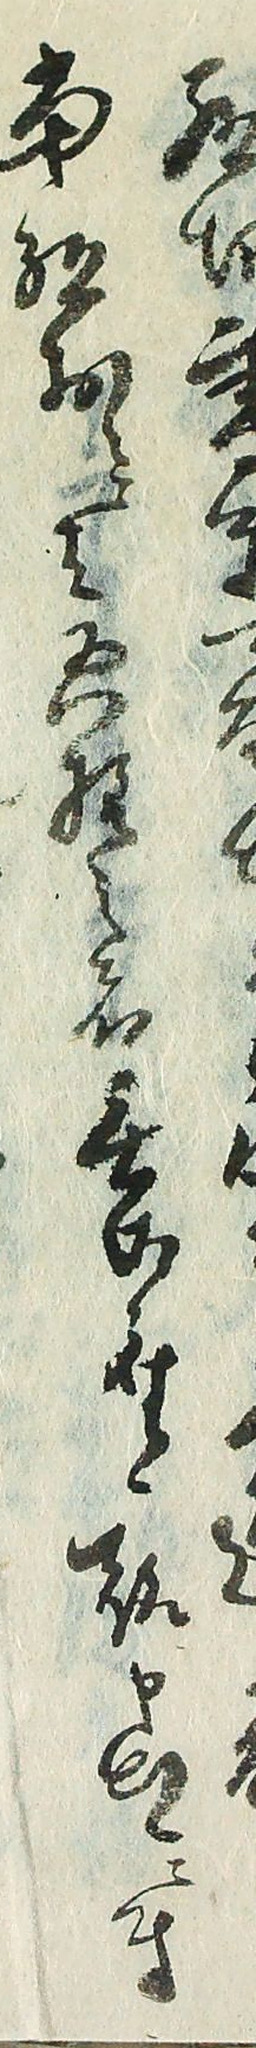当組村には右様之者無御座候趣申出候に付
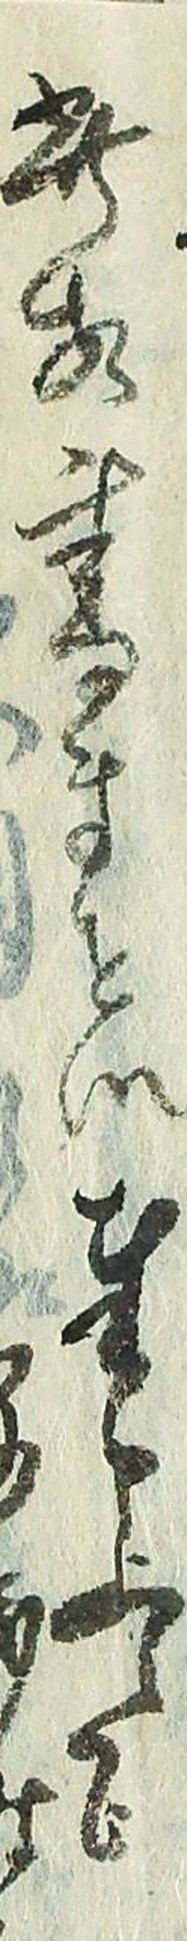此段書付を以奉申上候以上
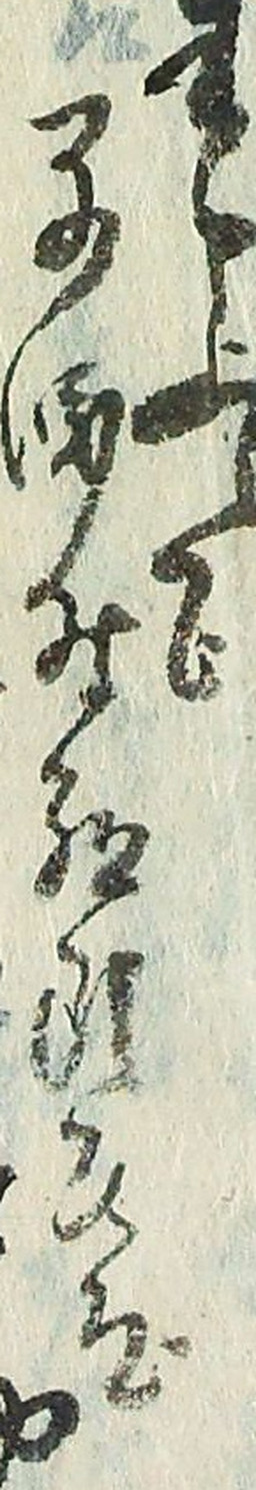早淵村組頭庄屋
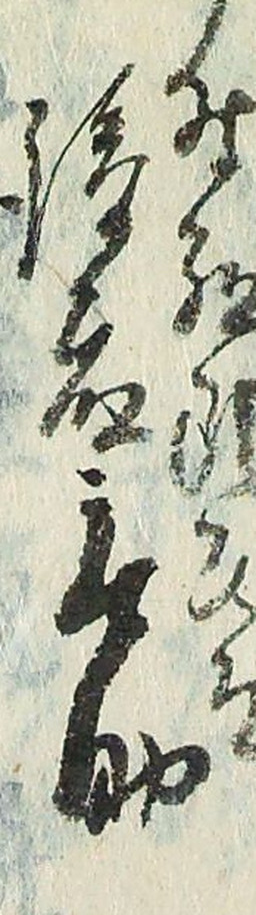後藤庄助
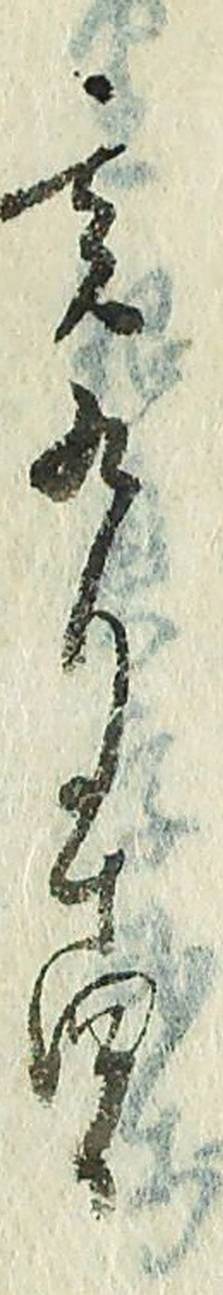亥九月十四日
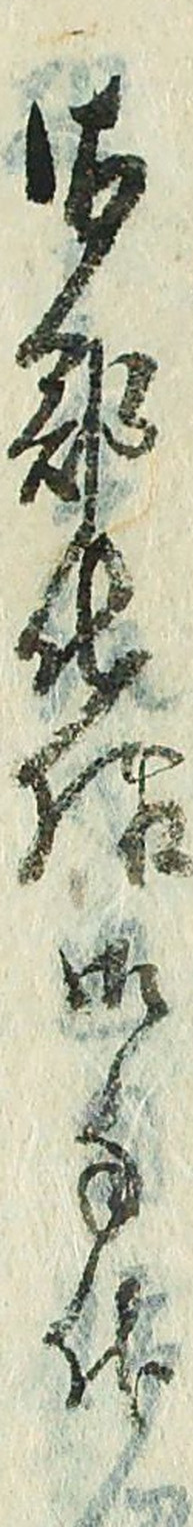御郡代様御手代
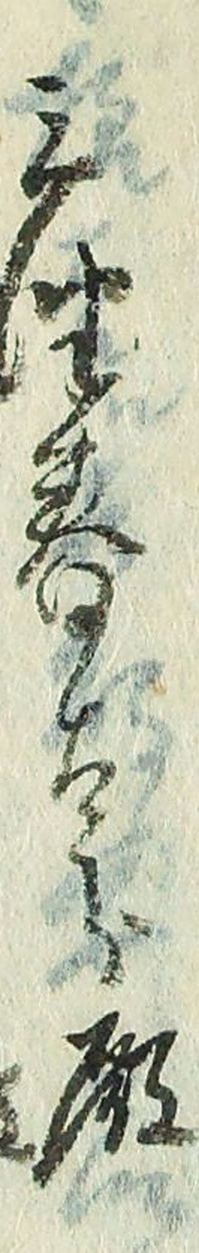三沢春太郎殿
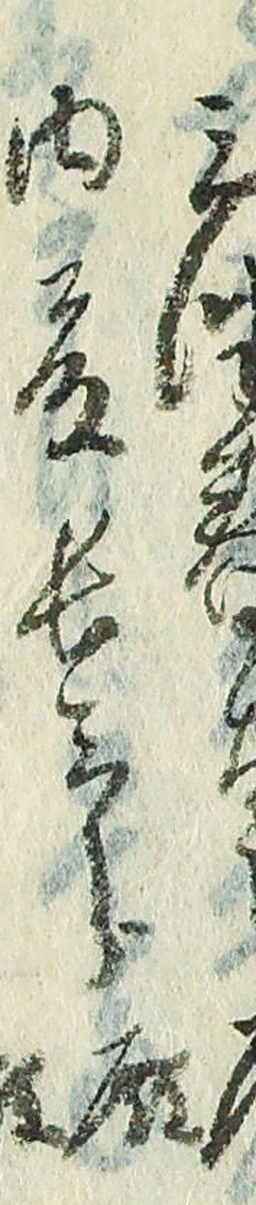内藤長三郎殿
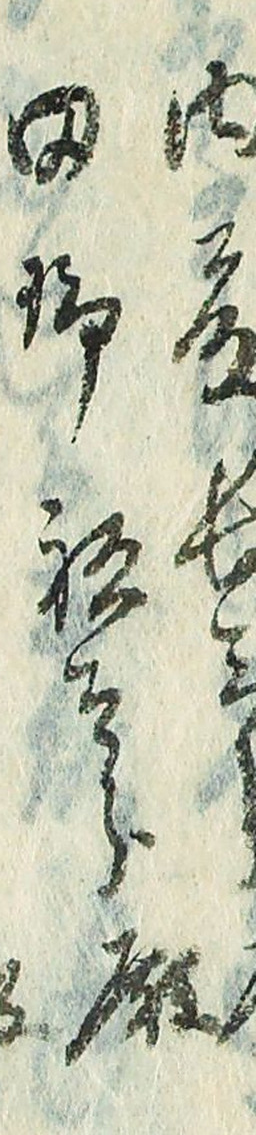田野祐太郎殿
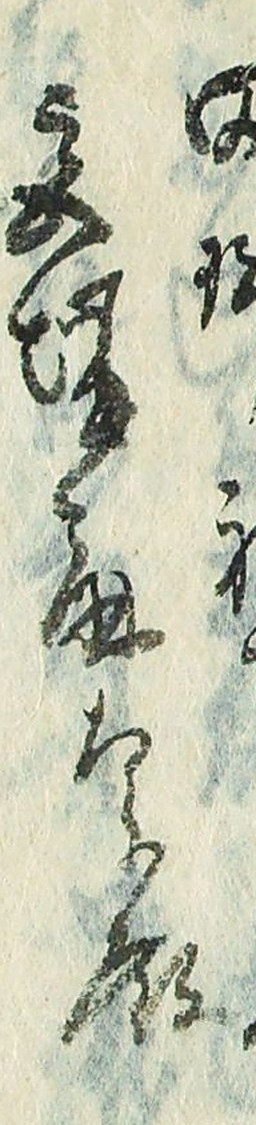宮城麻太郎殿
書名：諸御用御□受書控
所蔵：鳴門教育大学 Naruto University of Education
